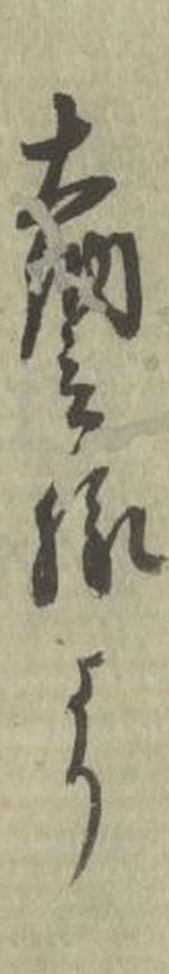大納言様より
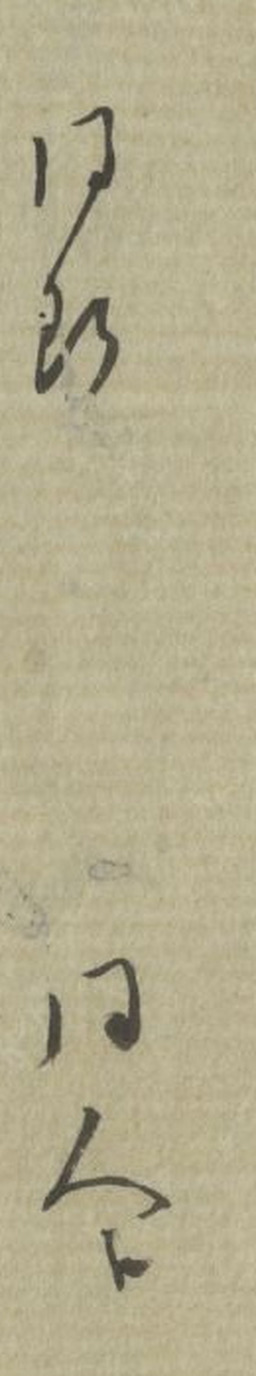同断同人え
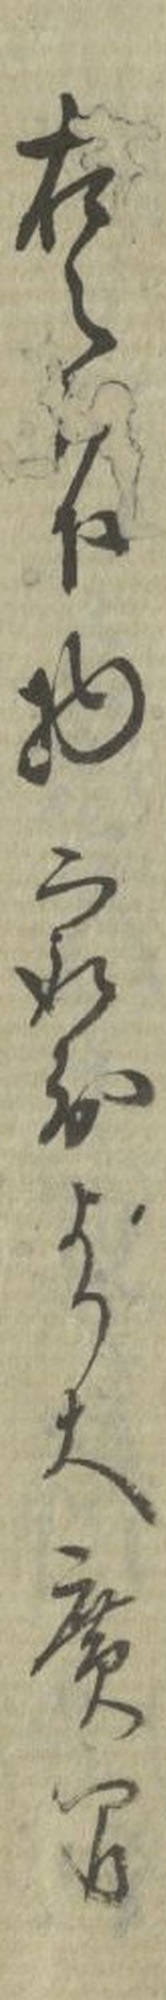右之被下物君前より大広間
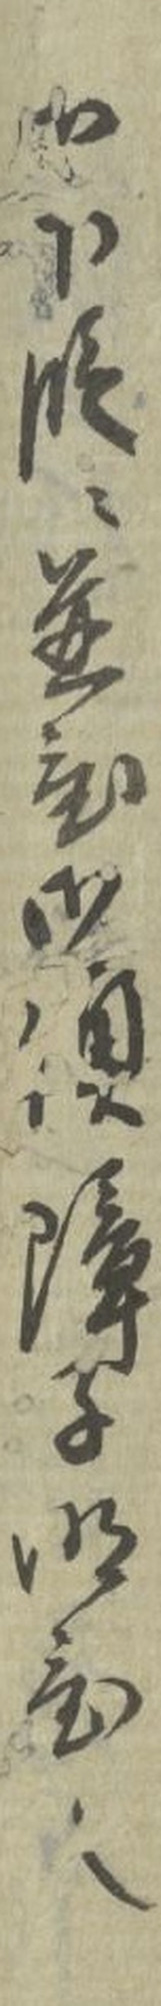御下段に並置御襖障子明置之
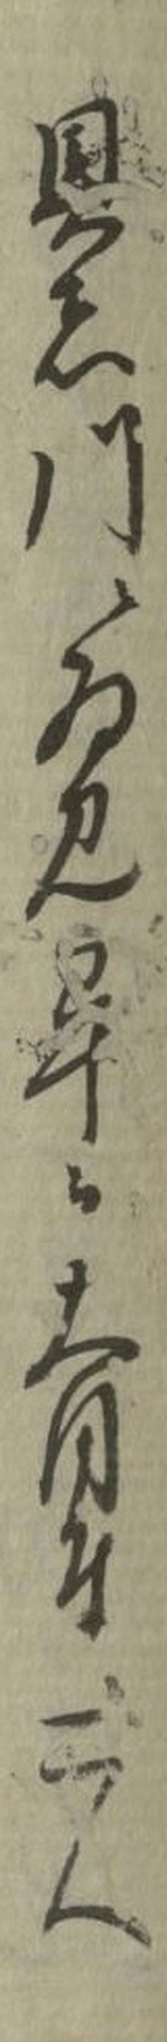具志川に為見畢而大目付二人
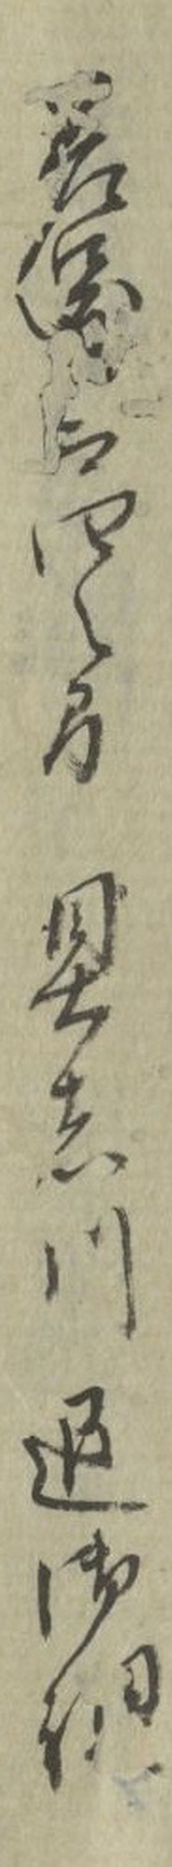差図而四之間具志川退御襖
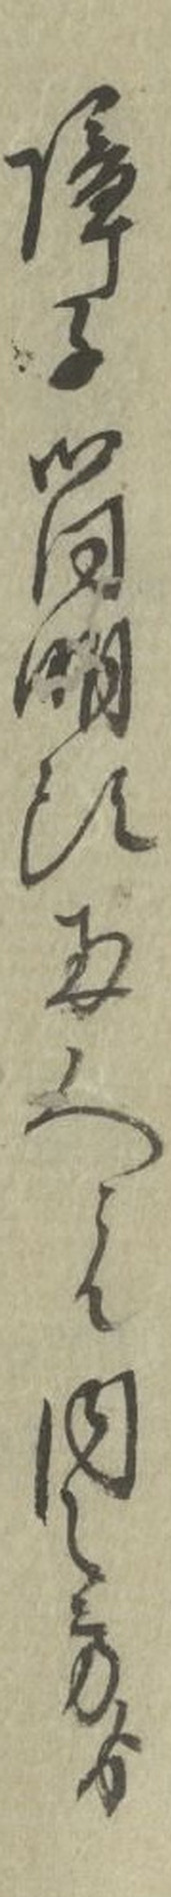障子御同朋頭両人にて内之方ゟ
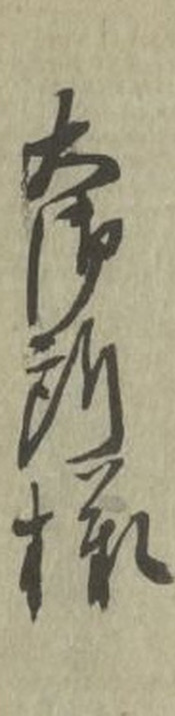大御所様

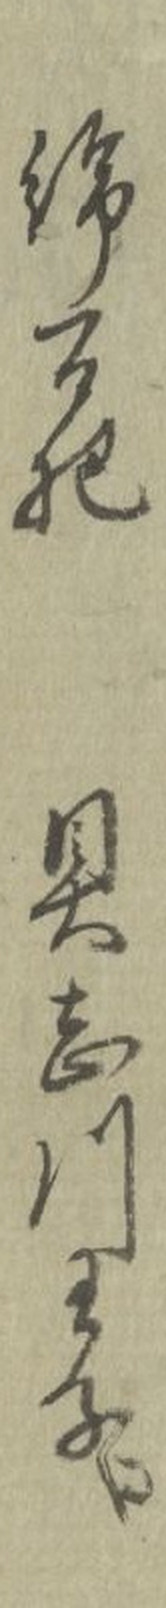綿百把具志川王子え
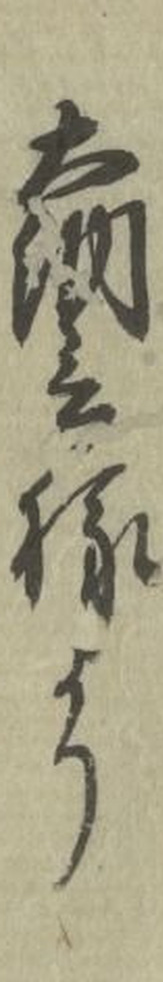大納言様より
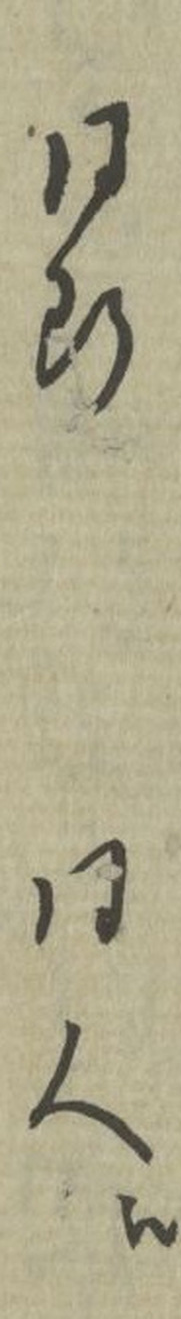同断同人え
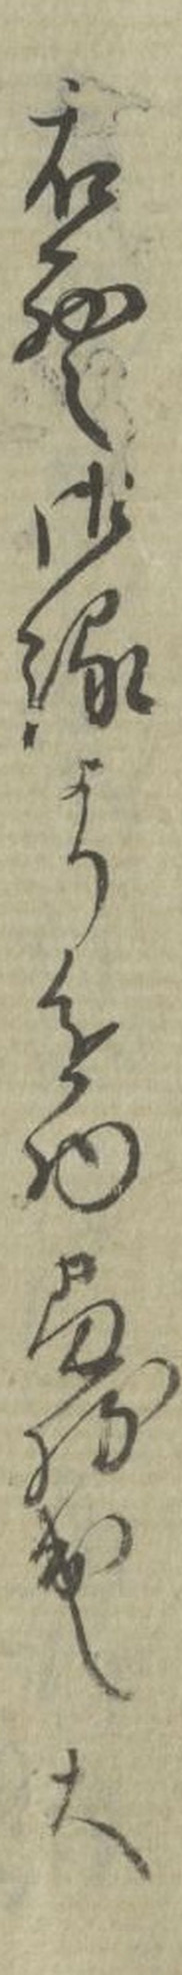右西之御縁より進物番持出之大
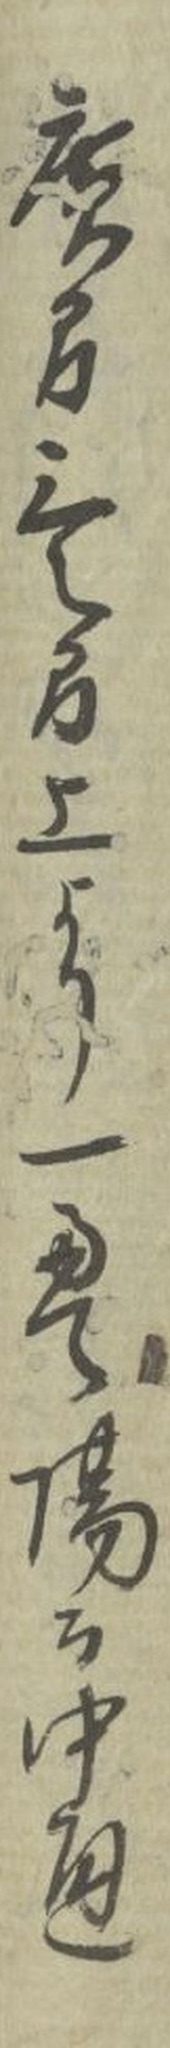広間三之間上より一畳隔而中通
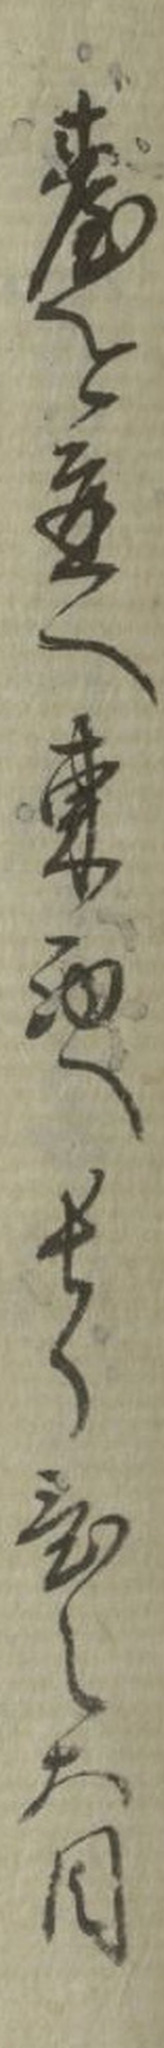台を並へ東西へ長く置之大目
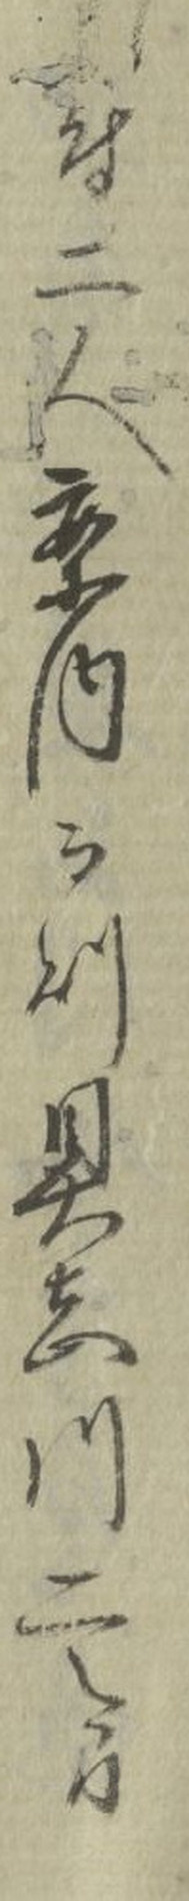付二人案内而則具志川二之間
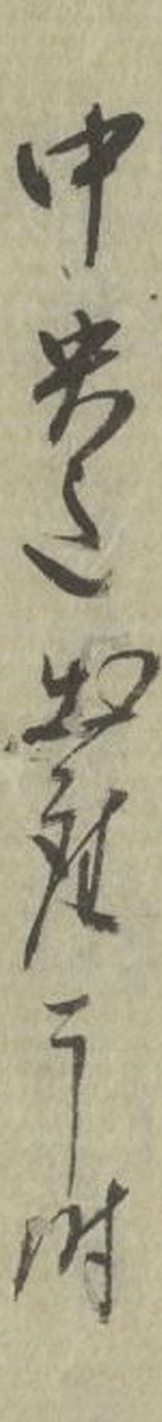中央迄出座于時
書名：琉球来朝記 自八至十四終
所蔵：University of the Ryukyus Library
